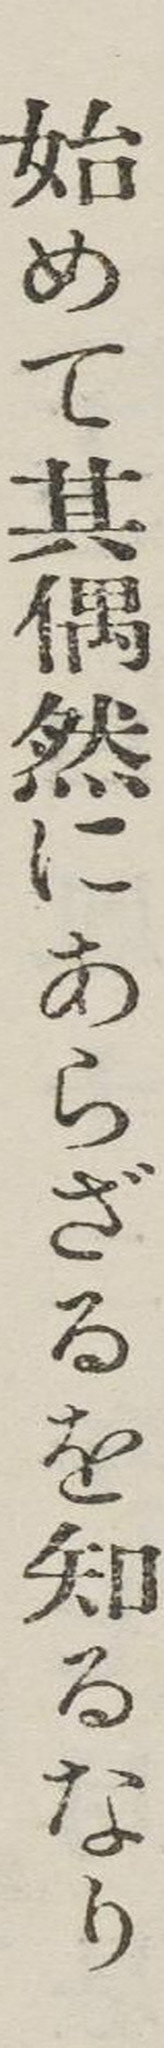始めて其偶然にあらざるを知るなり
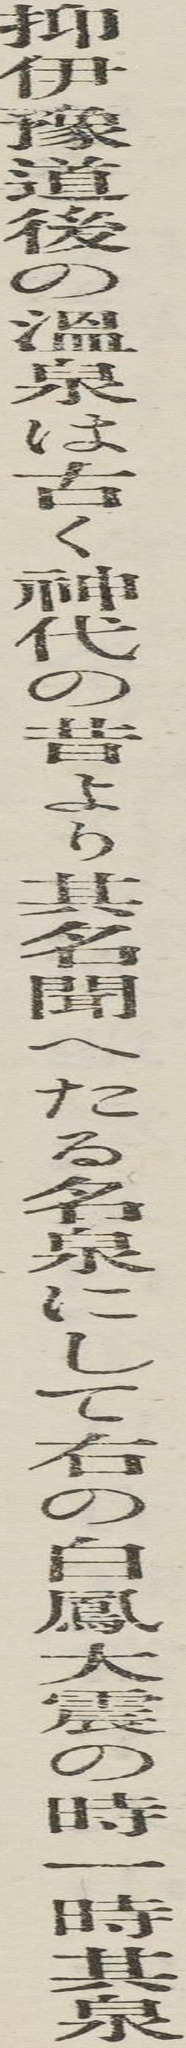抑伊予道後の温泉は古く神代の昔より其名聞へたる名泉にして右の白鳳大震の時一時其泉
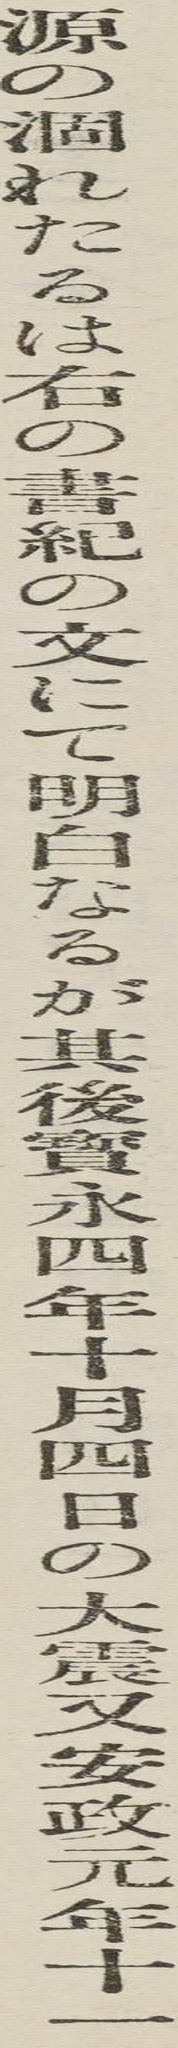源の涸れたるは右の書紀の文にて明白なるが其後宝永四年十月四日の大震又安政元年十一
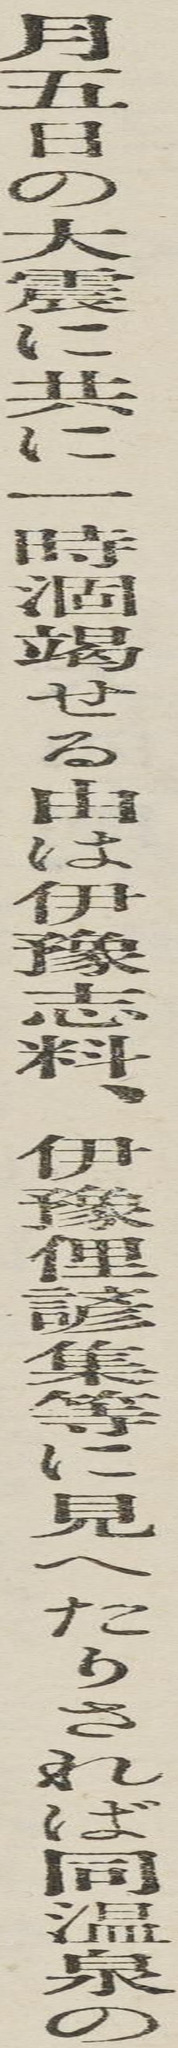月五日の大震に共に一時涸渇せる由は伊予志料、伊予俚諺集等に見へたりされば同温泉の
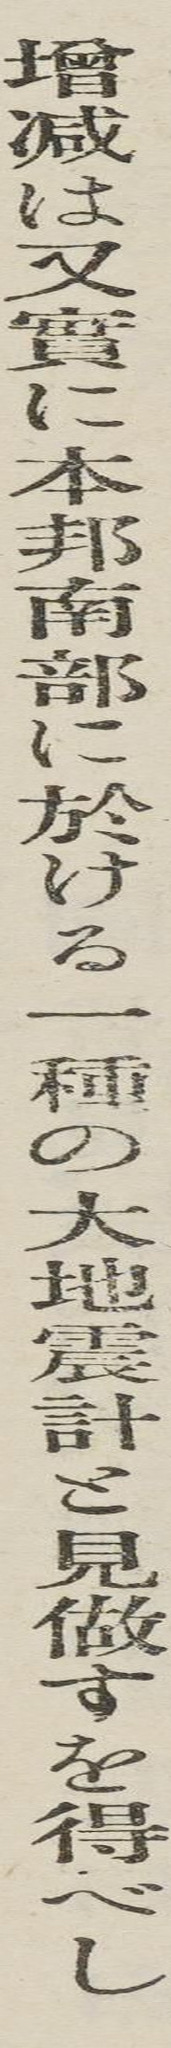増減は又実に本邦南部に於ける一種の大地震計と見做すを得べし
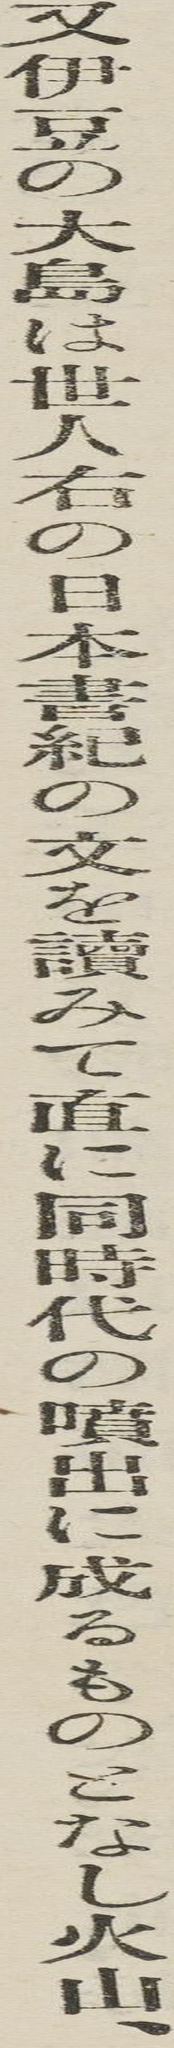又伊豆の大島は世人右の日本書紀の文を読みて直に同時代の噴出に成るものとなし火山、
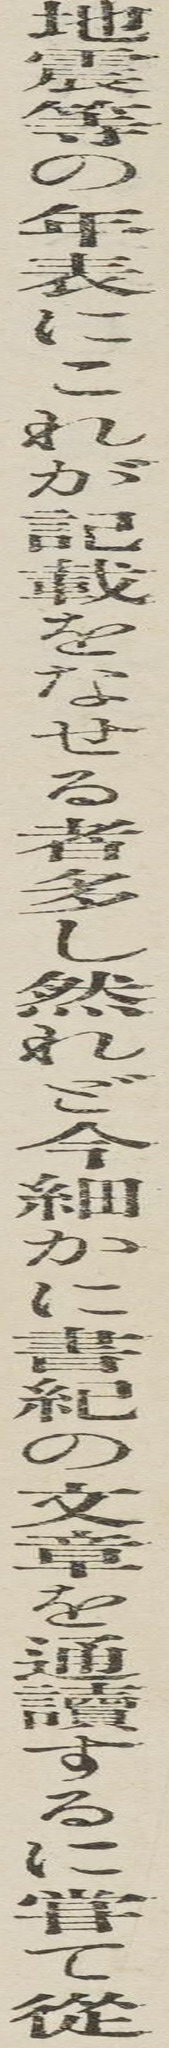地震等の年表にこれが記載をなせる者多し然れど今細かに書紀の文章を通読するに嘗て従
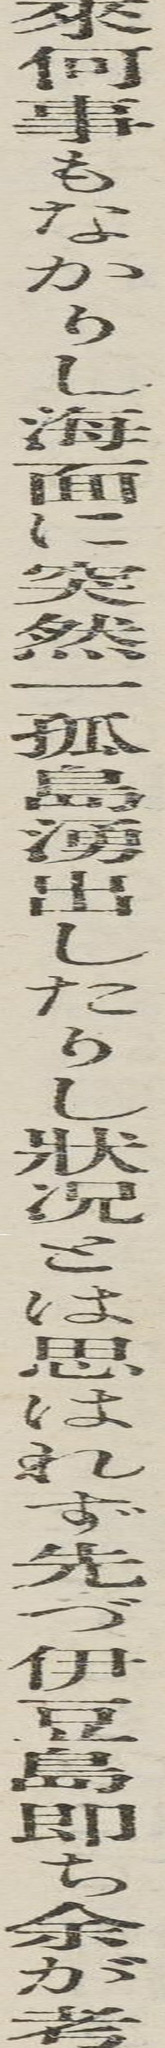来何事もなかりし海面に突然一孤島湧出したりし状況とは思はれず先づ伊豆島即ち余が考
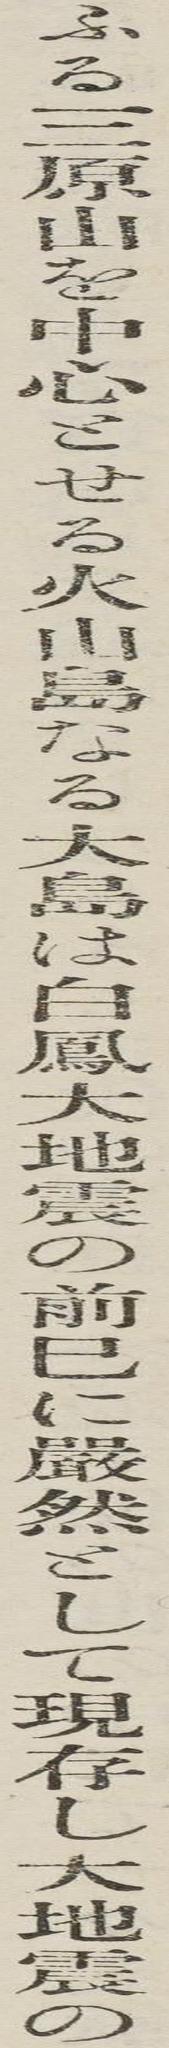ふる三原山を中心とせる火山島なる大島は白鳳大地震の前已に厳然として現存し大地震の
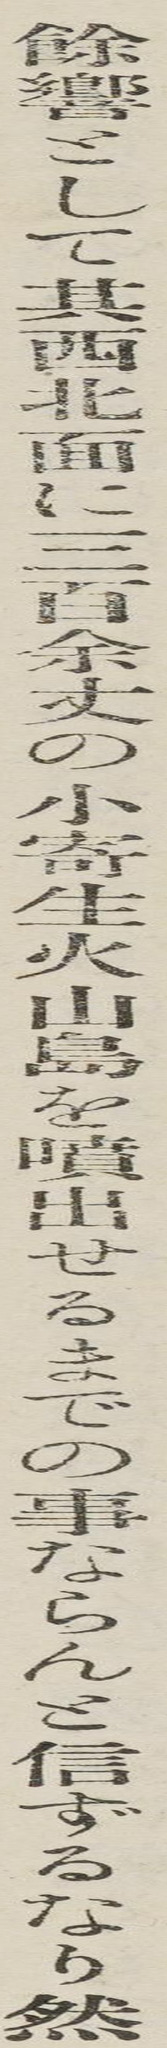余響として其西北面に三百余丈の小寄生火山島を噴出せるまでの事ならんと信ずるなり然
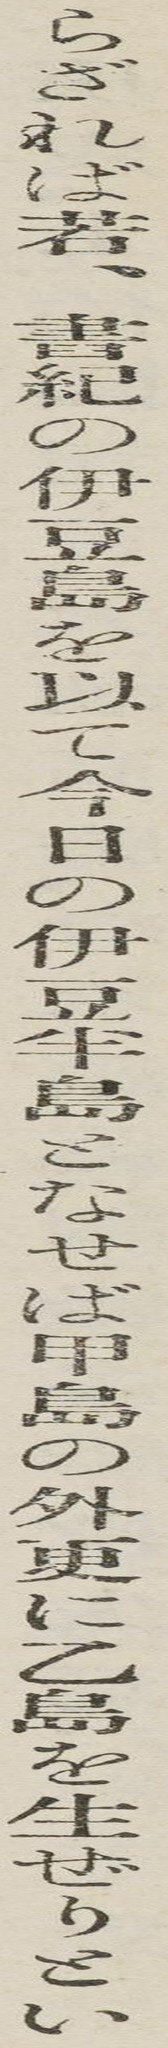らざれば若、書紀の伊豆島を以て今日の伊豆半島となせば甲島の外更に乙島を生ぜりとい
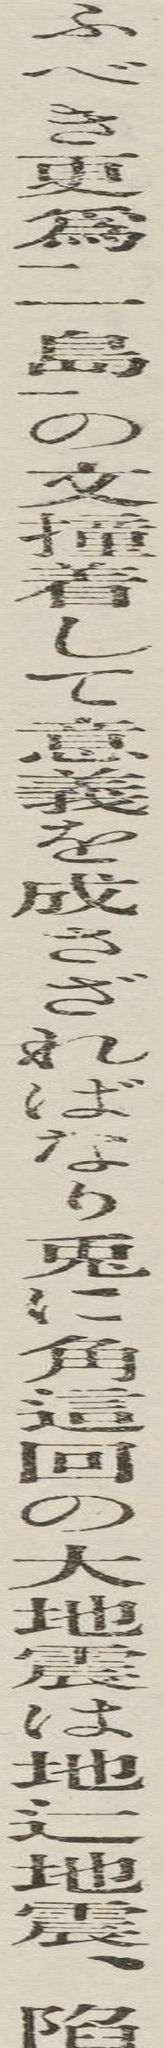ふべき更為一島の文撞着して意義を成さざればなり兎に角這回の大地震は地辷地震、陥
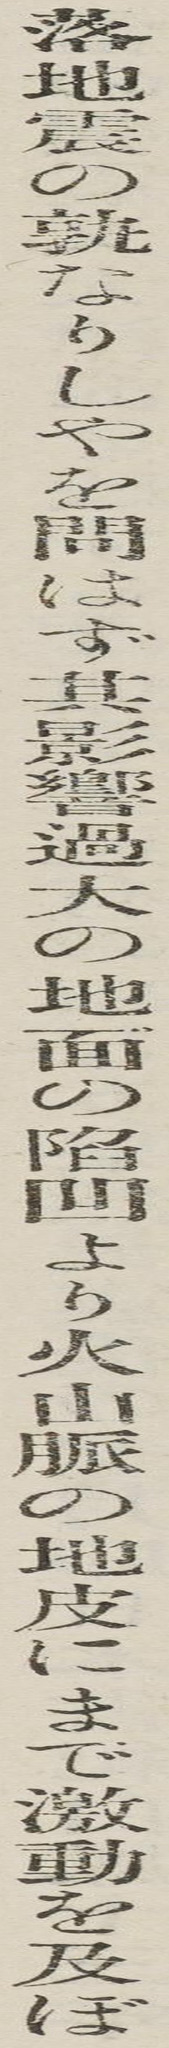落地震の孰なりしやを問はず其影響過大の地面の陥凹より火山脈の地皮にまで激動を及ぼ
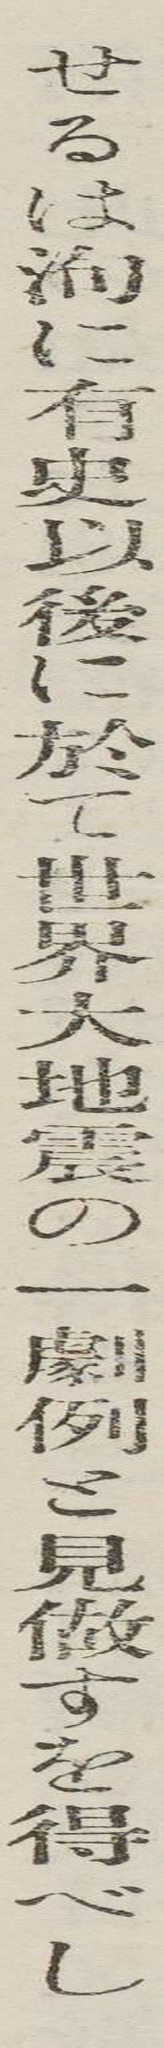せるは洵に有史以後に於て世界大地震の一劇例と見做すを得べし
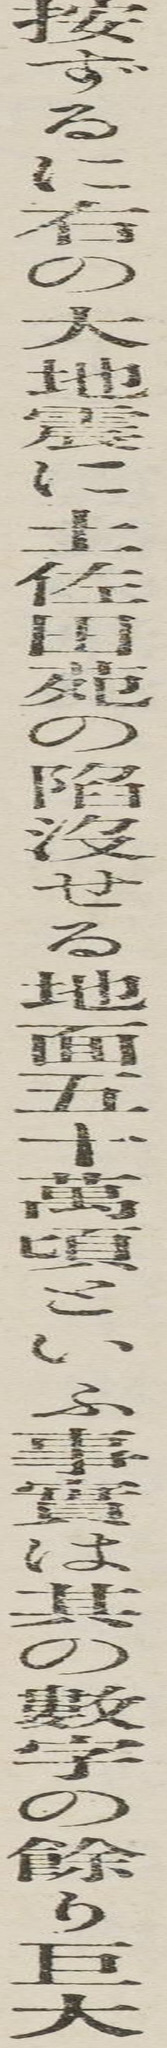按ずるに右の大地震に土佐田苑の陥没せる地面五十万頃といふ事実は其の数字の余り巨大
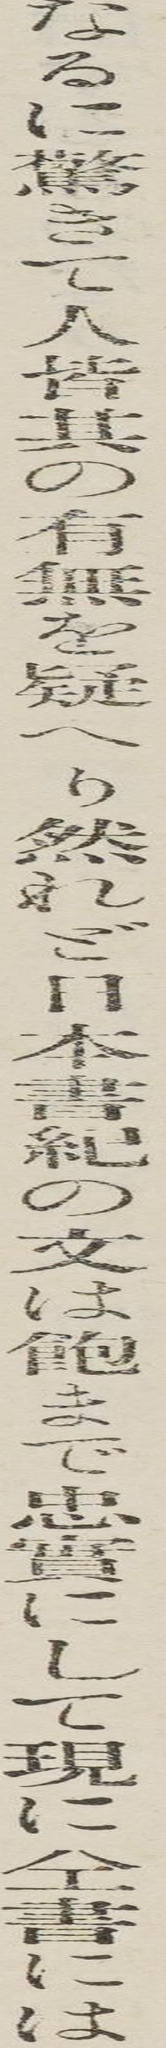なるに驚きて人皆其の有無を疑へり然れど日本書紀の文は飽まで忠実にして現に同書には
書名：土佐古今ノ地震
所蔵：東京大学地震研究所図書室 Earthquake Research Institute Library, The University of Tokyo, JAPAN
